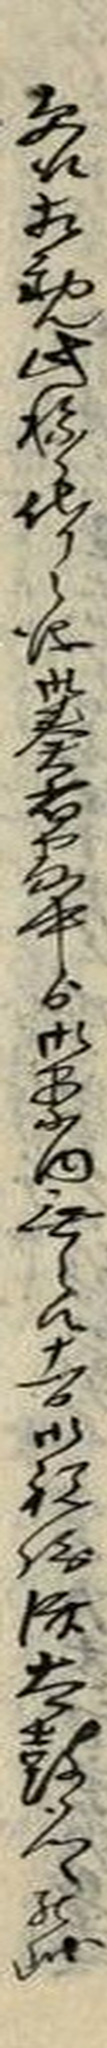受取相勤候此移り代り之儀御奏者番中ゟ御案内無之候十一日御祝儀済太鼓御門へ罷越
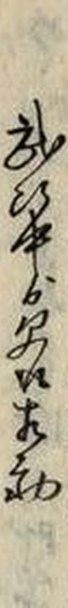武頭中ゟ受取相勤
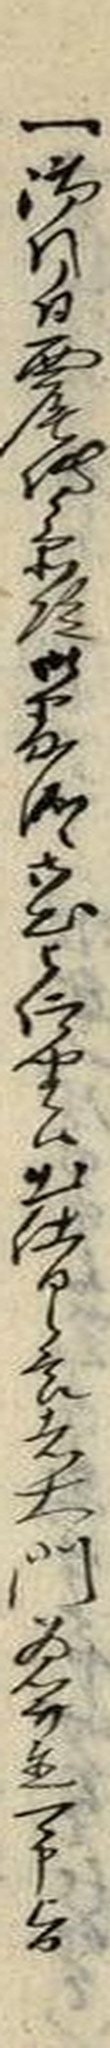一御目付西尾伝兵衛殿御番所へ御出被仰聞候ハ出仕日之節は大門為開置可申旨
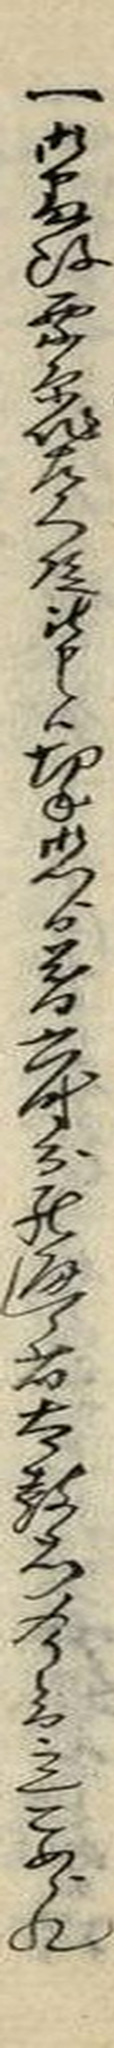一御番改栗原作左衛門殿被申候ハ切手御門ゟ暮六時分罷通候者太鼓御門〆り候而立こめられ
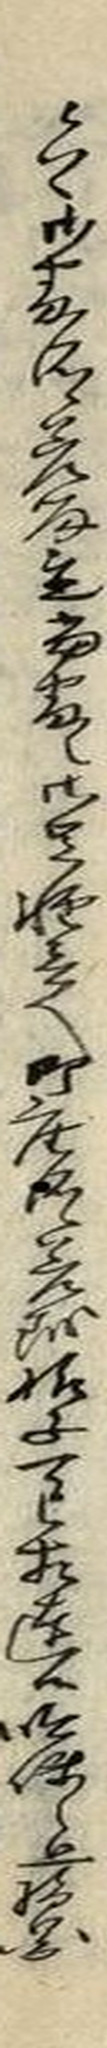候ハヽ御番所へ差留置当番之御足軽壱人御座所へ差越様子可被相達候吟味之上指図
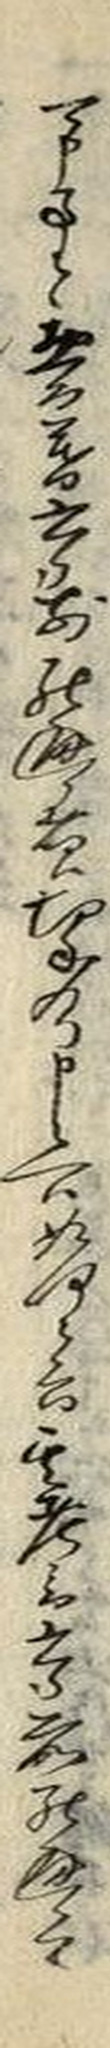可申事候惣而暮六ツ前罷通候者切手〆り申候へハ如何候間其考ニ而六ツ前罷通候ハヽ
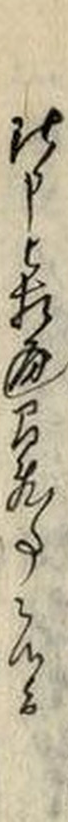断申被相通間敷候事ニ候旨
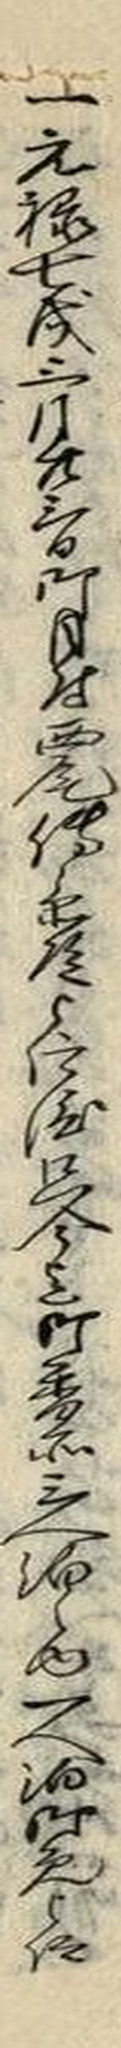一元禄七戌三月廿三日御目付西尾伝兵衛殿被仰渡只今迄御番所三人泊候内一人泊御免被仰
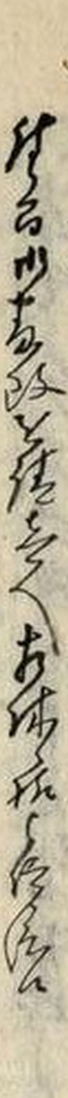付候間御番改を請壱人相休候様被仰渡候
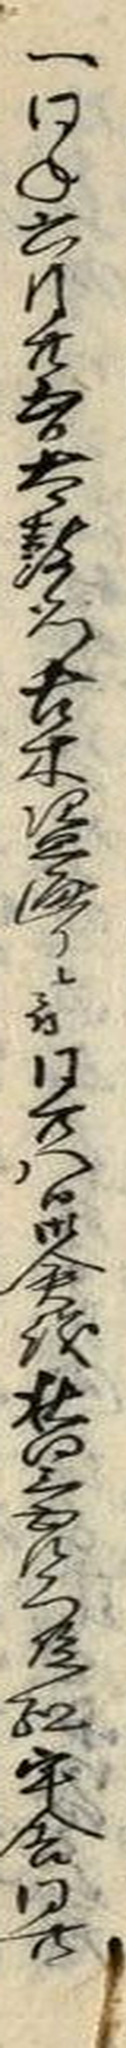一同年六月廿五日太鼓御門古木盗通り候ニ付同廿八日御僉儀秋田三五左衛門殿組牢舎同廿
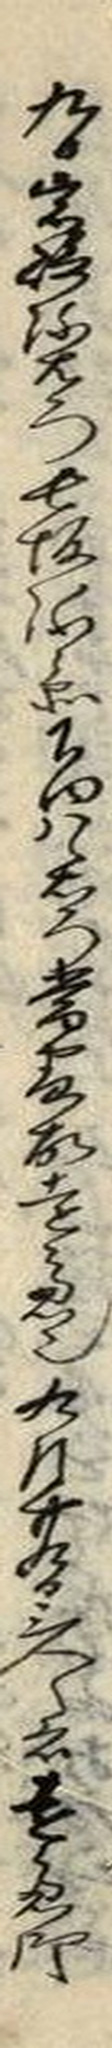九日岩崎弥右衛門長坂弥兵衛下田八郎左衛門当番故遠慮也九月廿九日三人之者遠慮御
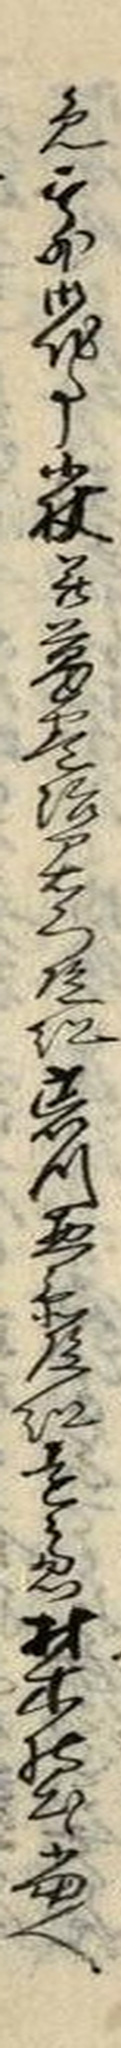免其外御作事小杖并葛巻治部右衛門殿組荒川惣兵衛殿組遠慮材木持出候当人

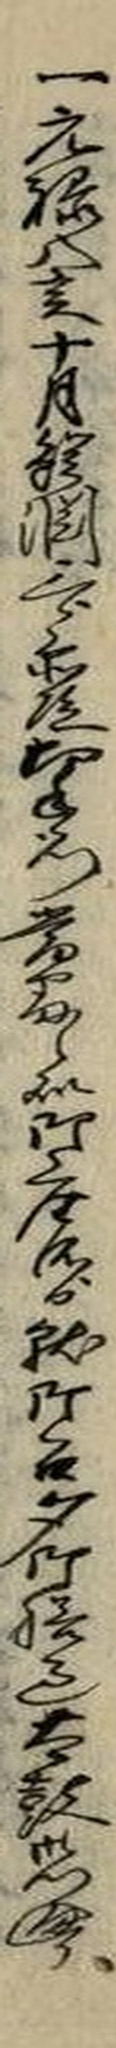一元禄八亥十月鯉淵三郎兵衛殿切手御門当番之処御座所ゟ就御召夕御膳過太鼓御門通り
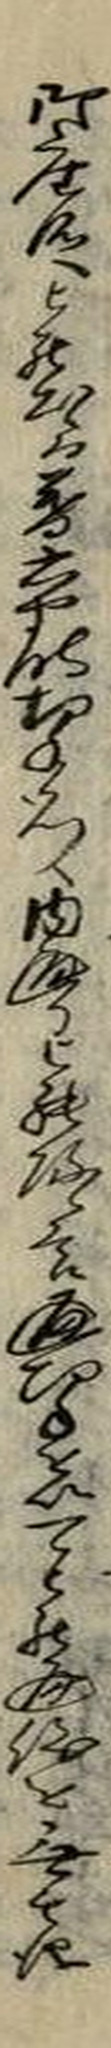御座所へ被罷出候て暮六半時切手御門之内通り被罷帰候節通切手を以可被罷通儀を無其儀
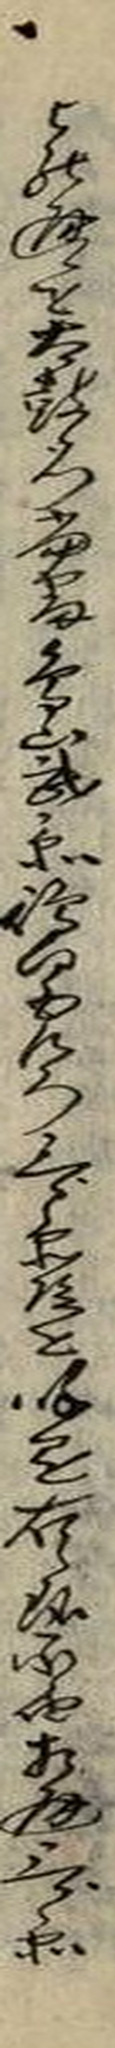被罷通候を太鼓御門当番鳥山武兵衛嶋田五左衛門三郎兵衛殿を呼懸右之趣承届相通三郎兵衛
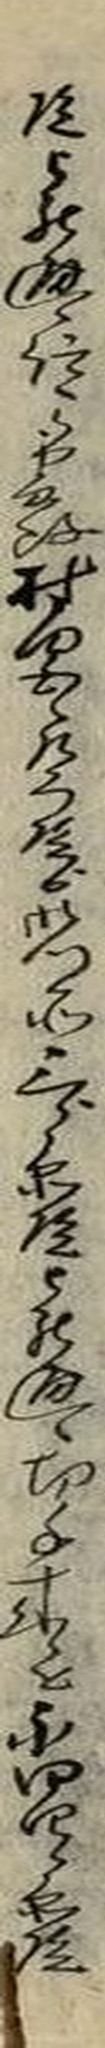殿被罷通候跡へ御番改村田五郎左衛門殿ゟ御門所三郎兵衛殿被罷通候切手来候を永田四郎兵衛殿
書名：御門御櫓之部
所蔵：福井県文書館 Fukui Prefectural Archives
